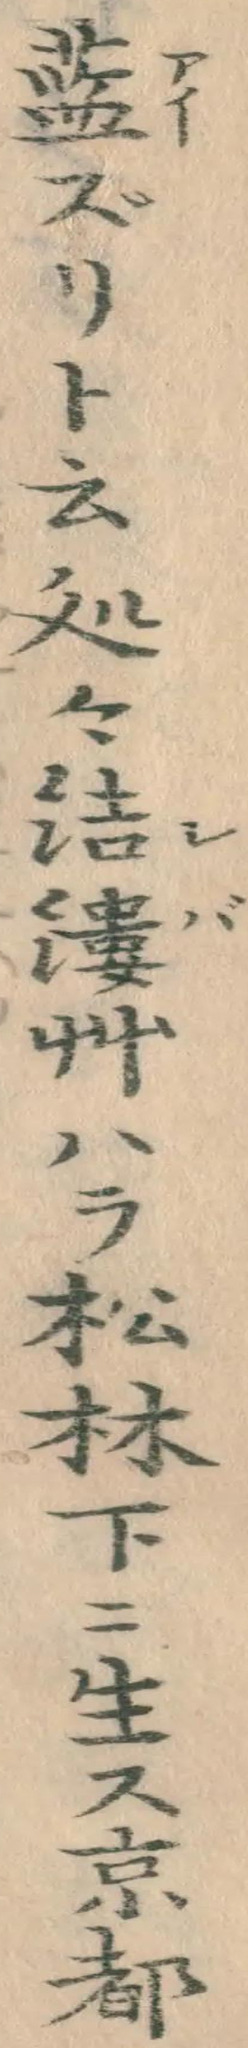藍ズリト云処々結縷草ハラ松林下ニ生ス京都
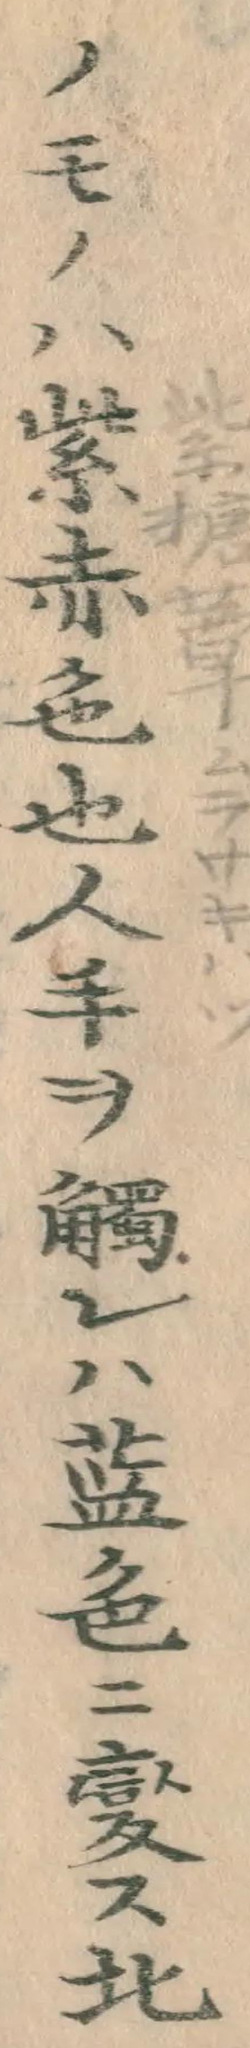ノモノハ紫赤色也人手ヲ触レハ藍色ニ変ス北
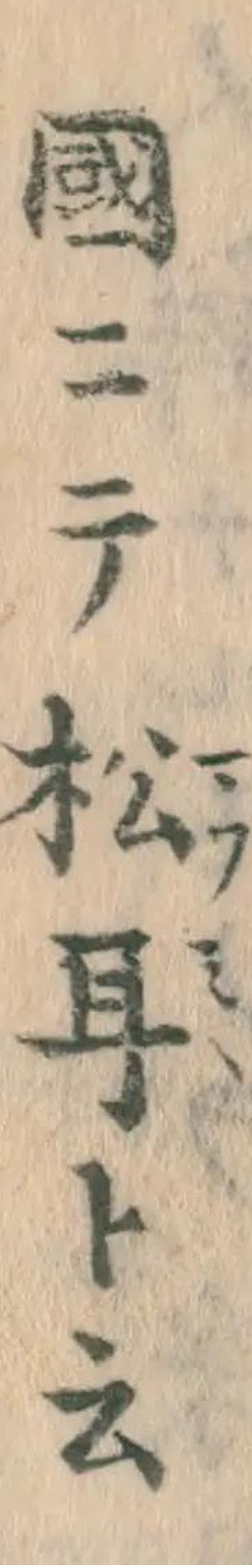国ニテ松耳ト云
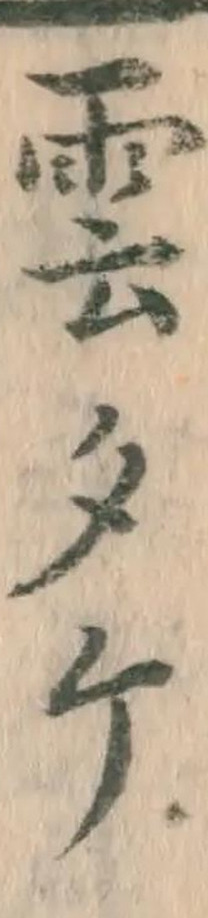雲タケ
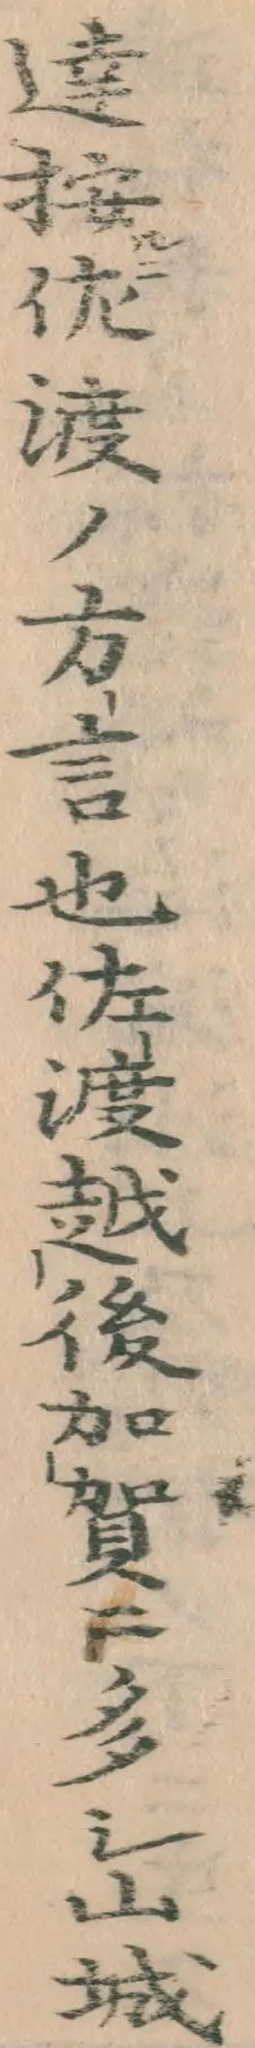達按佐渡ノ方言也佐渡越後加賀ニ多シ山城
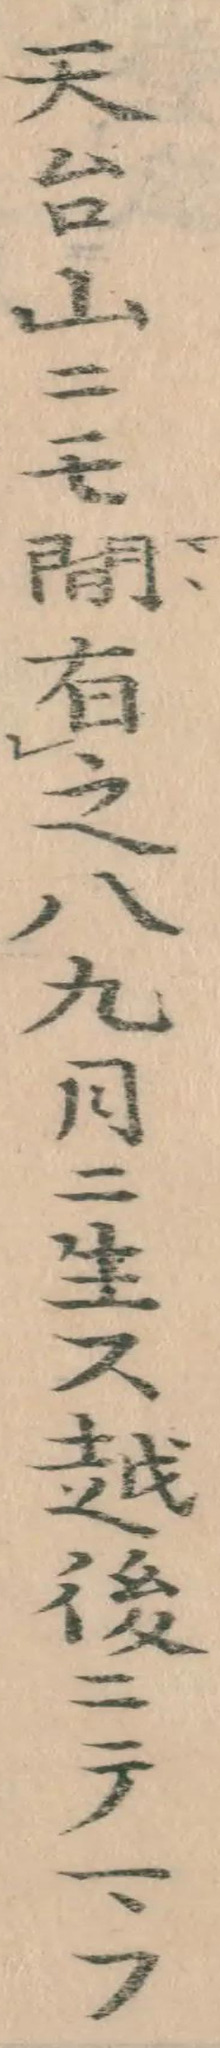天台山ニモ間有之八九月ニ生ス越後ニテマフ
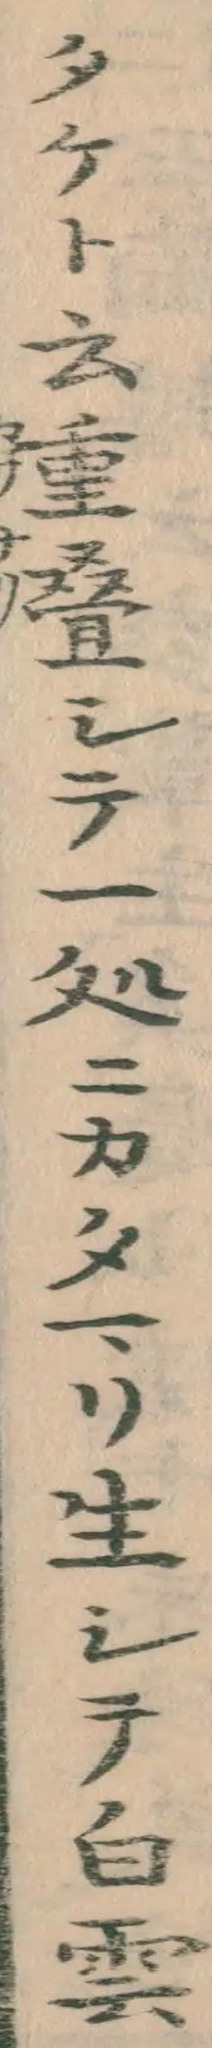タケト云重畳シテ一処ニカタマリ生シテ白雲
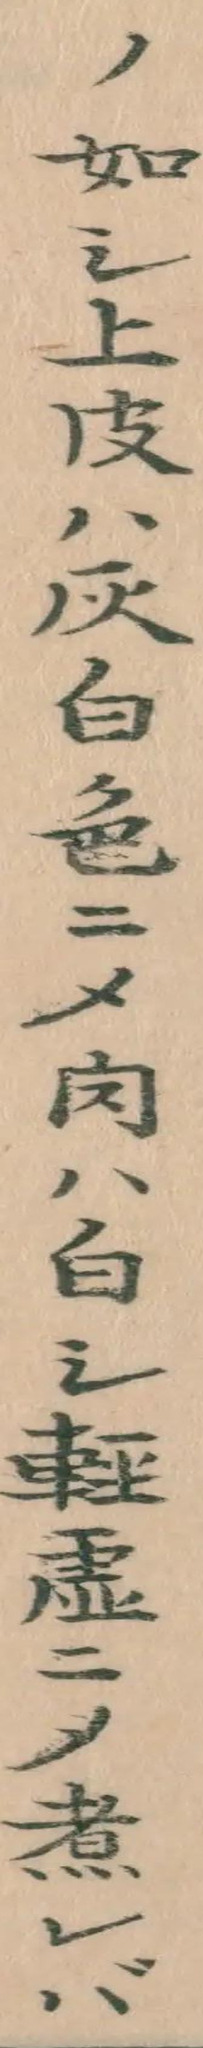ノ如シ上皮ハ灰白色ニシテ肉ハ白シ軽虚ニシテ煮レバ
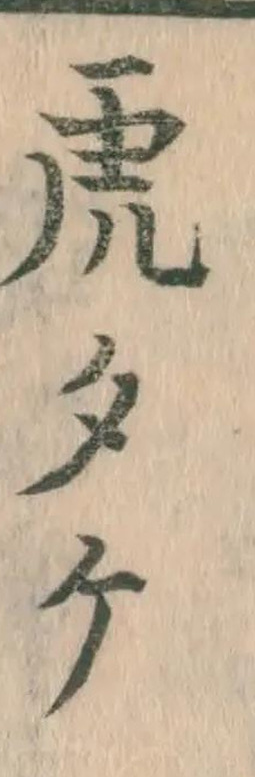虎タケ
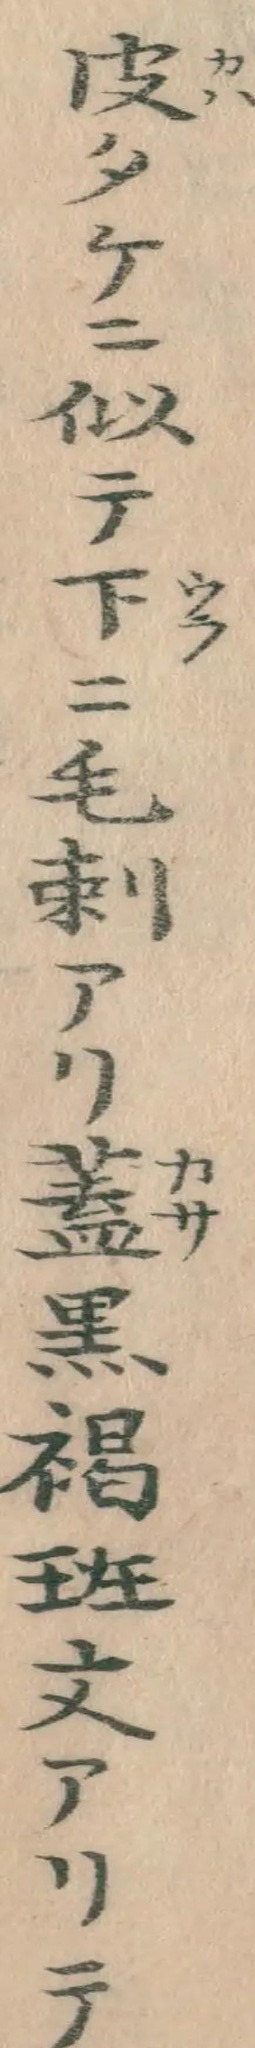皮タケニ似テ下ニ毛刺アリ葢黒褐班紋アリテ
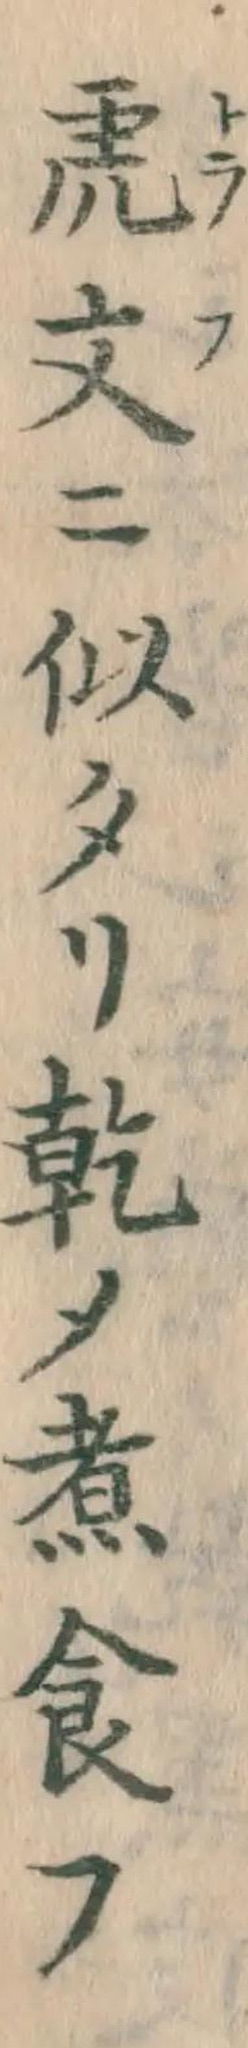虎文ニ似タリ乾シテ煮食フ
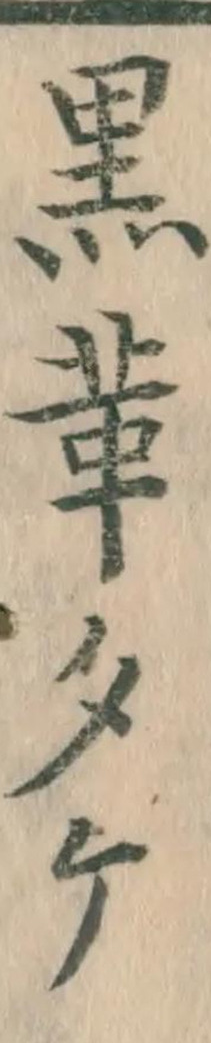黒革タケ

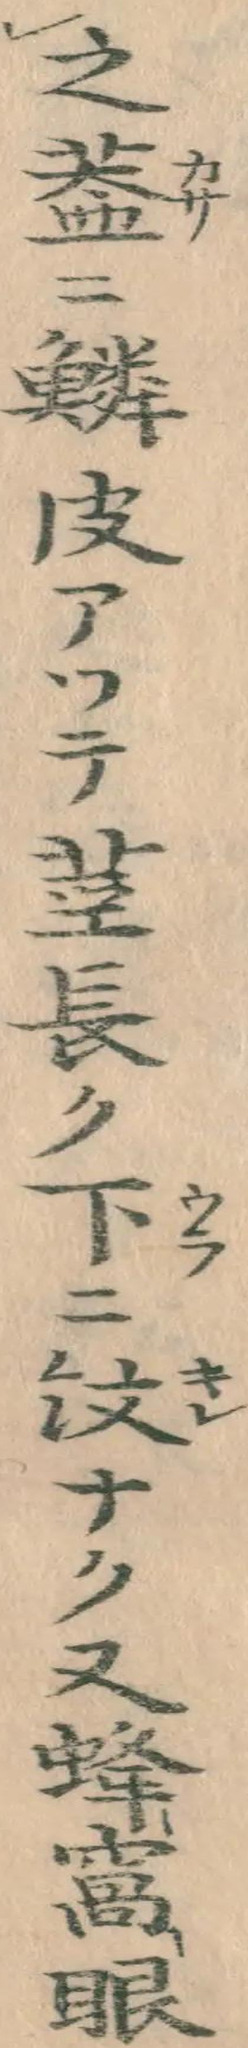之葢ニ鱗皮アツテ茎長ク下ニ紋ナク又蜂窩眼
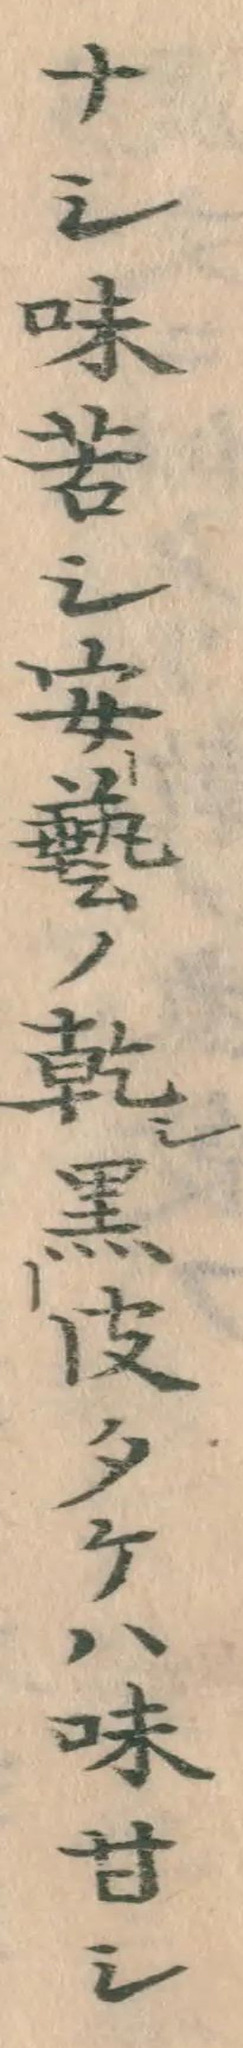ナシ味苦シ安芸ノ乾黒皮タケハ味甘シ
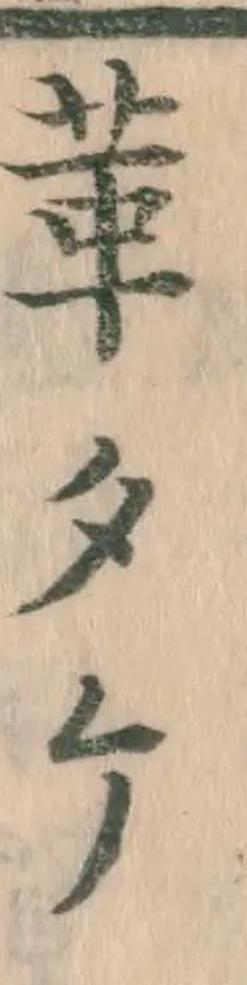革タケ
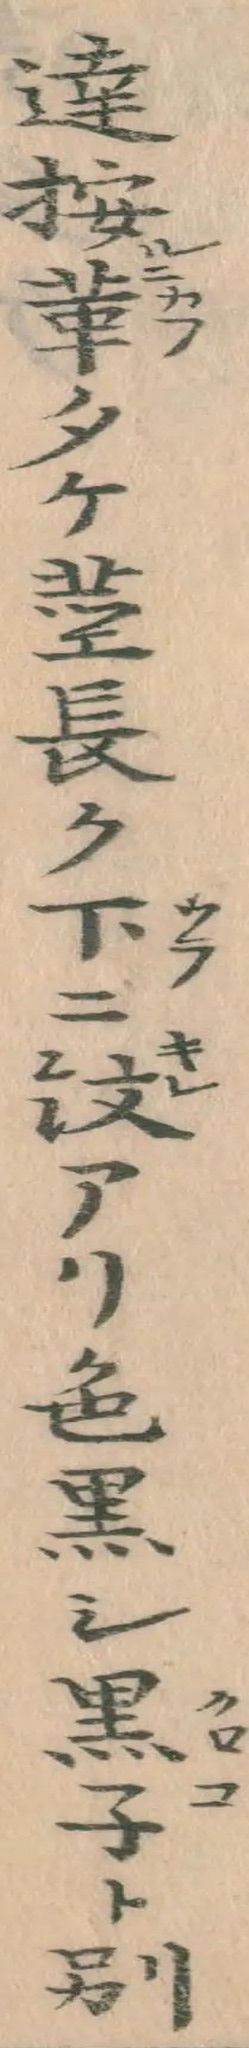達按革タケ茎長ク下ニ紋アリ色黒シ黒子ト別
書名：怡顔斎菌品 2巻
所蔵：国立国会図書館 National Diet Library, JAPAN
